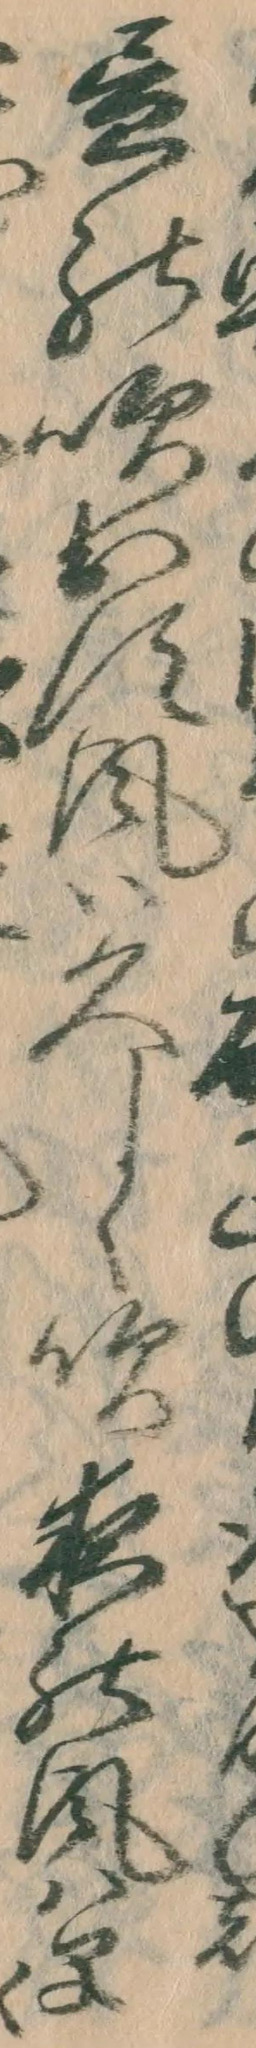晝の吹出す風ハ久しく吹夜の風ハ早く
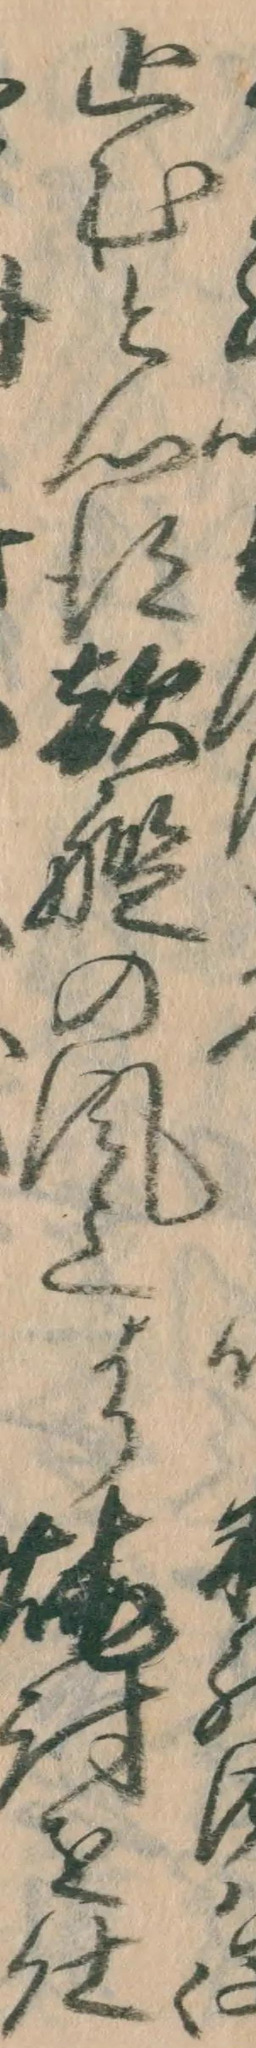止むと心得敵艦の風上より燒討を仕
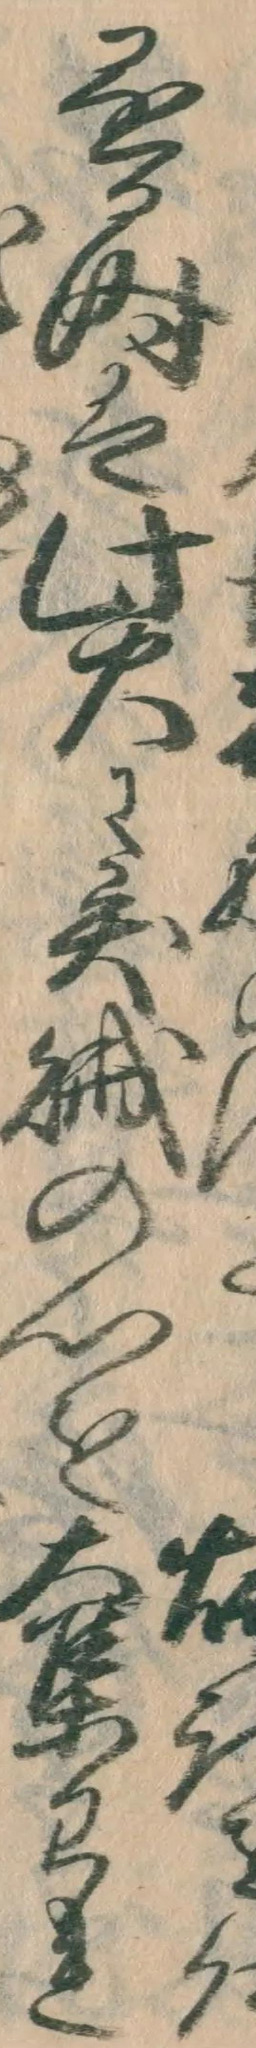懸る時は此火に夷賊の心を奪われ
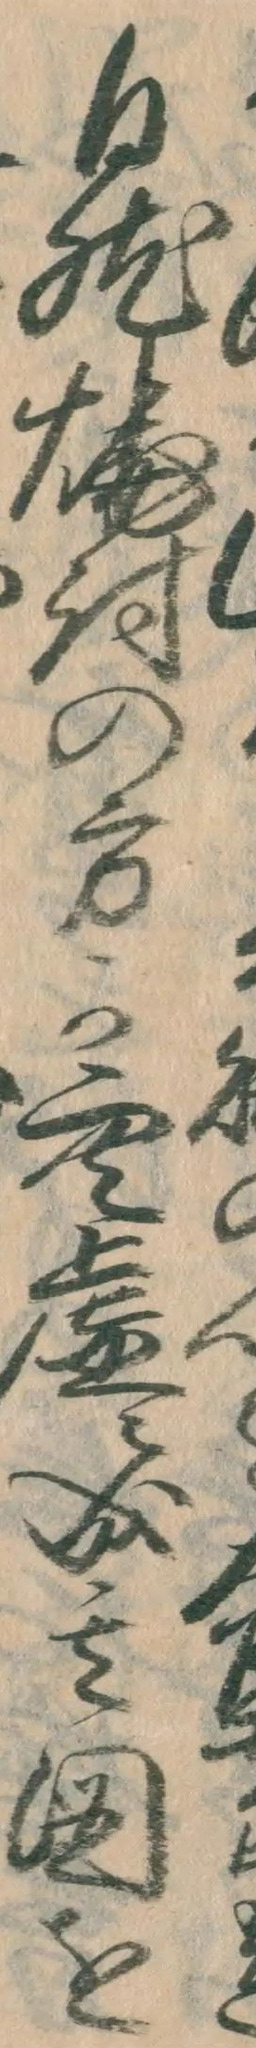自然燒討の方か空虚ニ成其図を
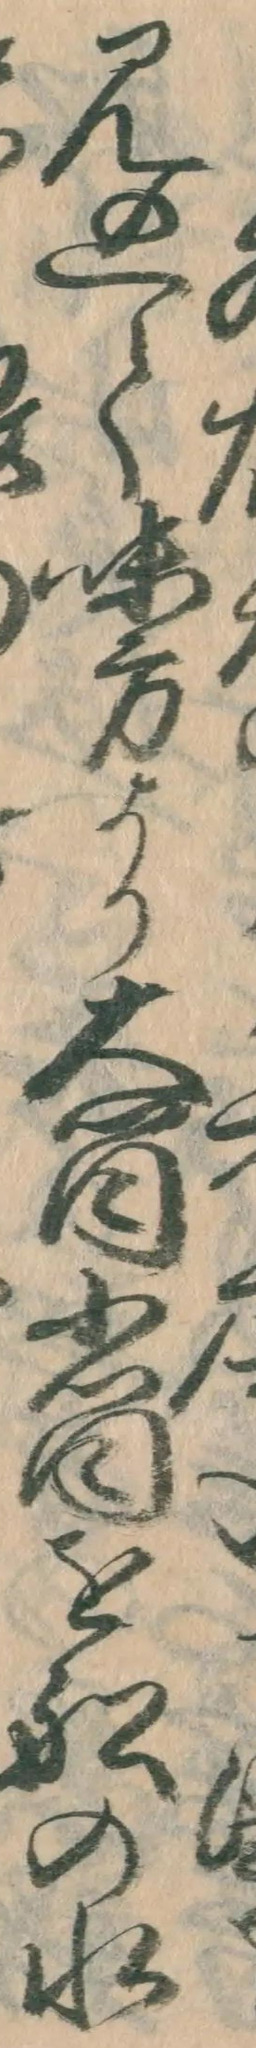見込て味方より大筒小筒を船の水
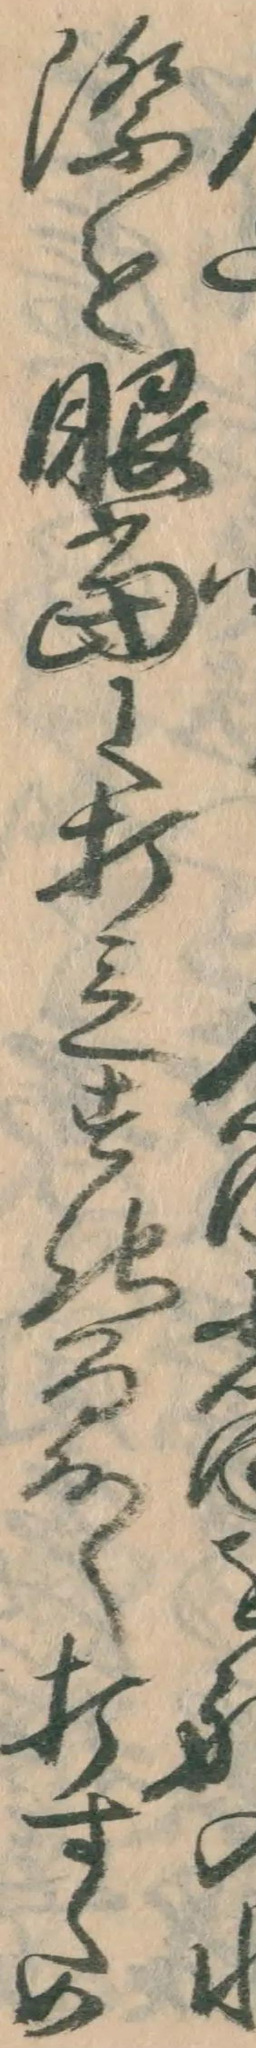際を眼當に打立すきまなく打すゝめ

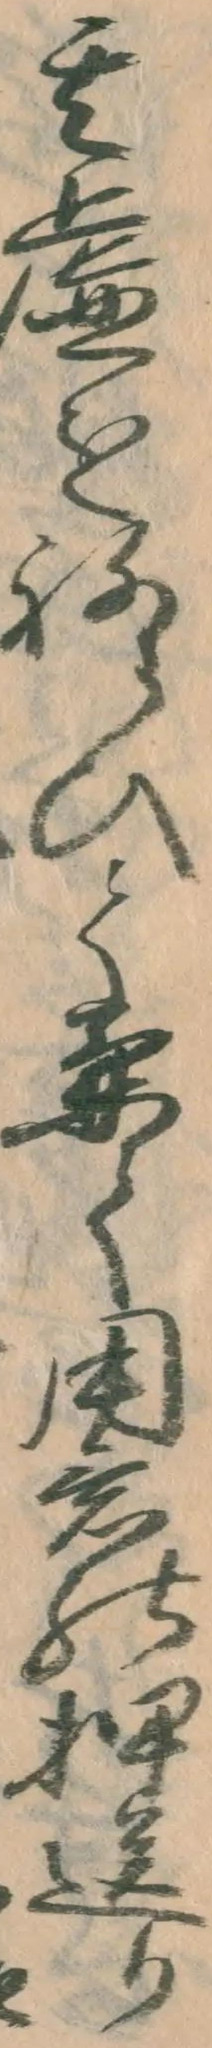其虚をねらひて兼て用意の押送り
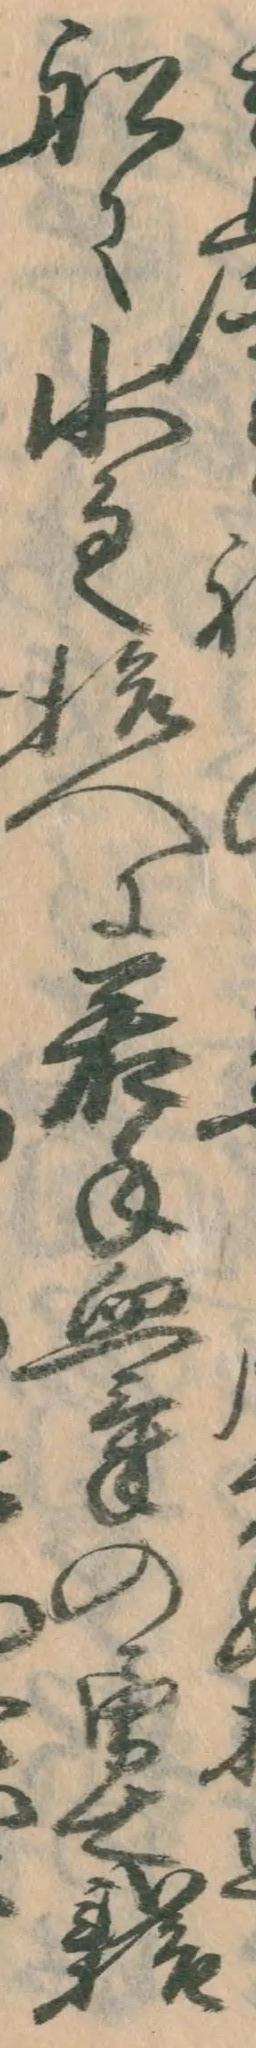船に水主拾人に若手血気の勇士弐拾
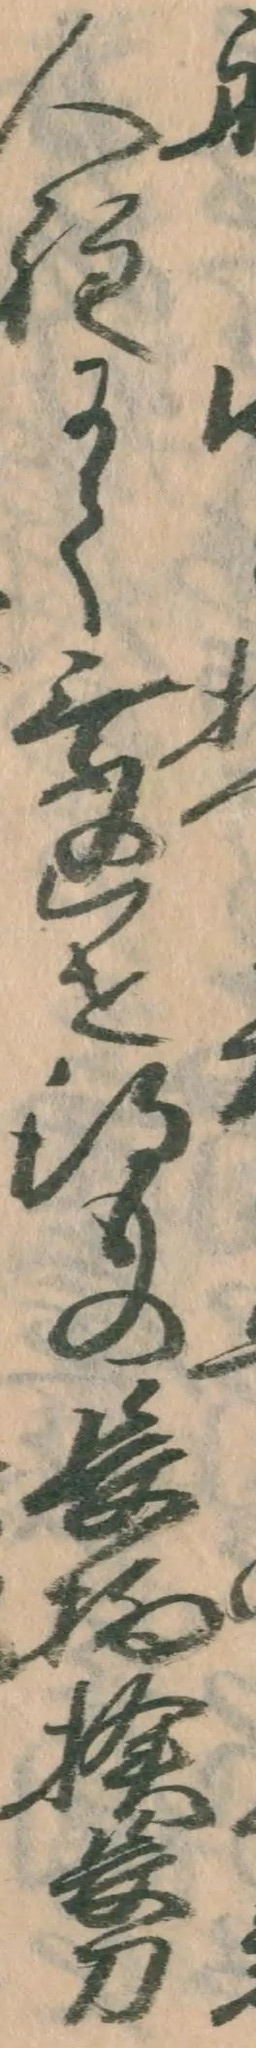人程にて乗込せ得もの長柄槍長刀
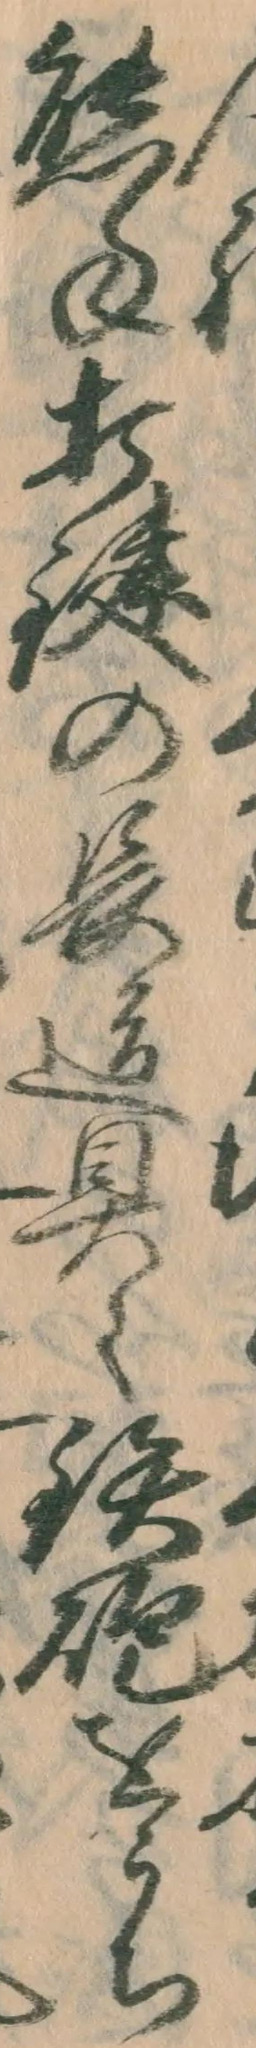熊手打鍵の長道具に鉄砲をうち
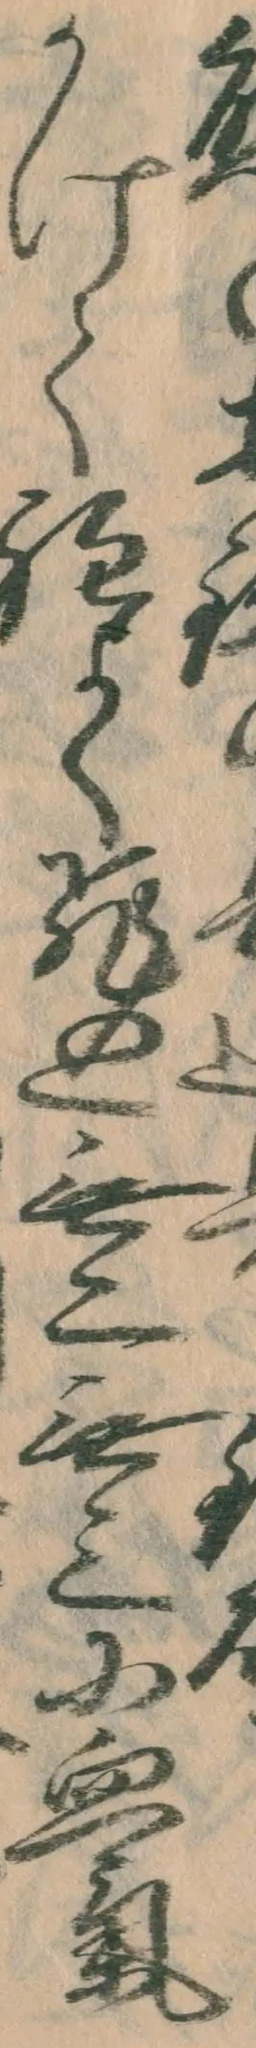かけて程よく飛込無二無三に血気
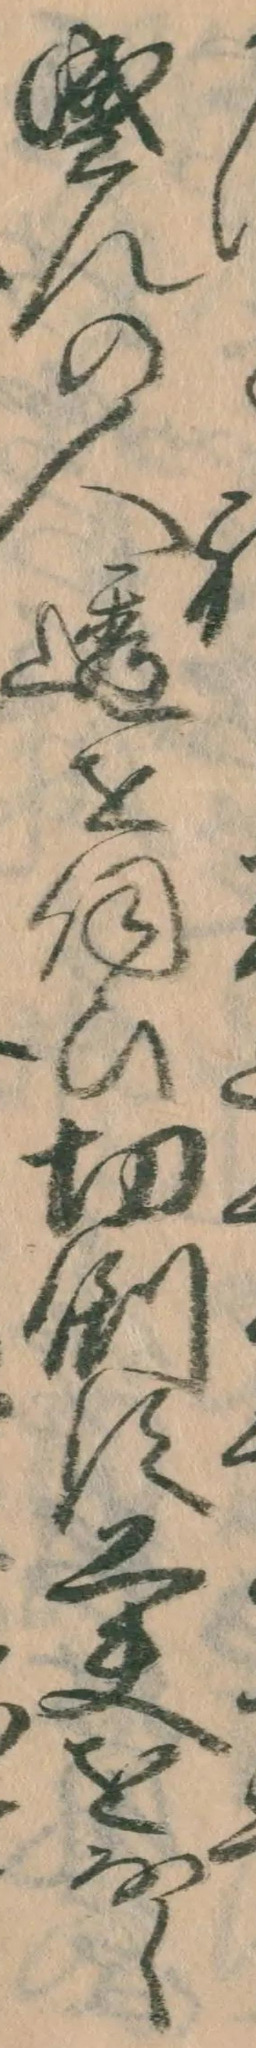盛んの人透を伺ひ切倒す工夫をなし
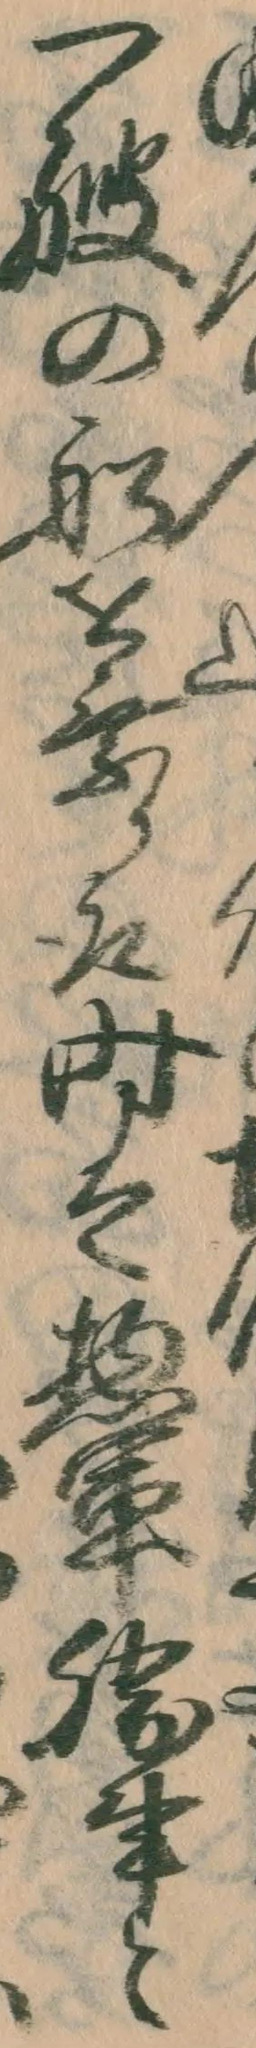一艘の船を乗り取時は惣軍勝事に
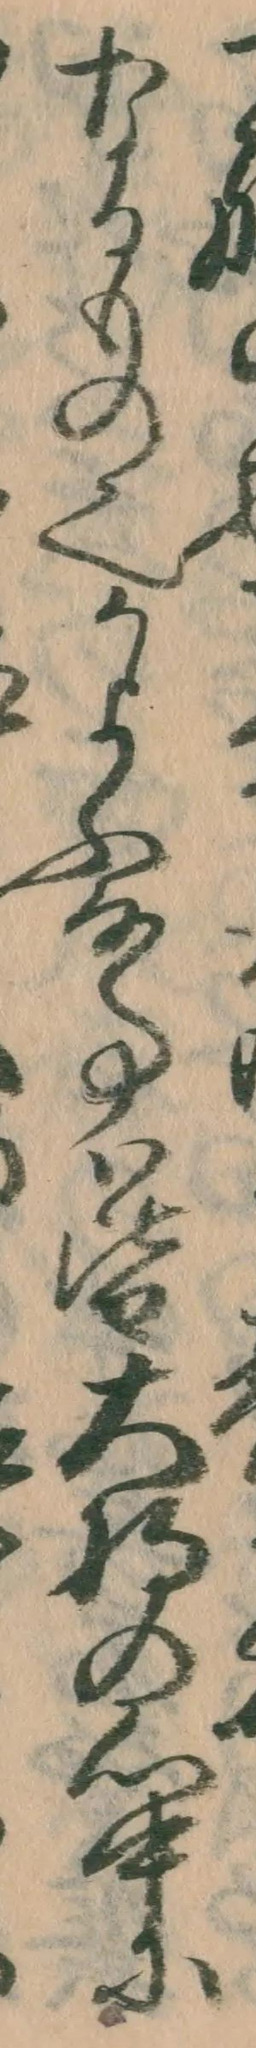なるもの也かよふな事ハ皆大将の心中に
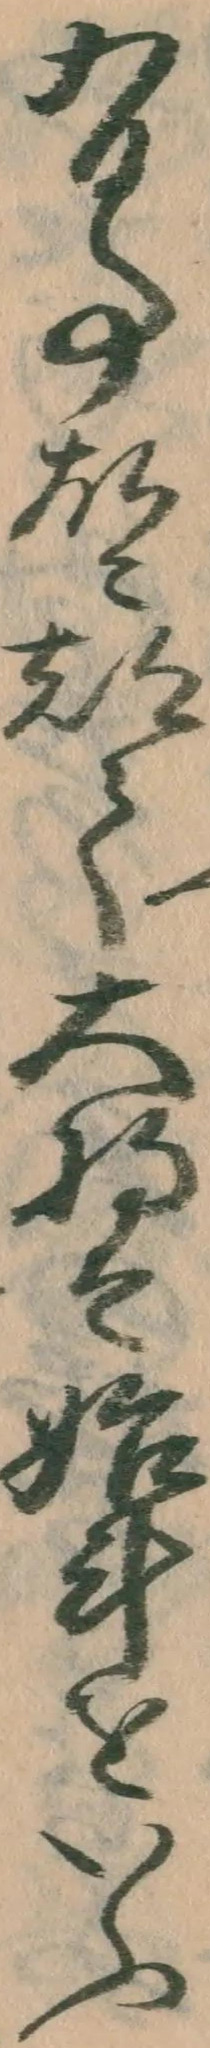有事故ニ都而大将は始斗をいふ
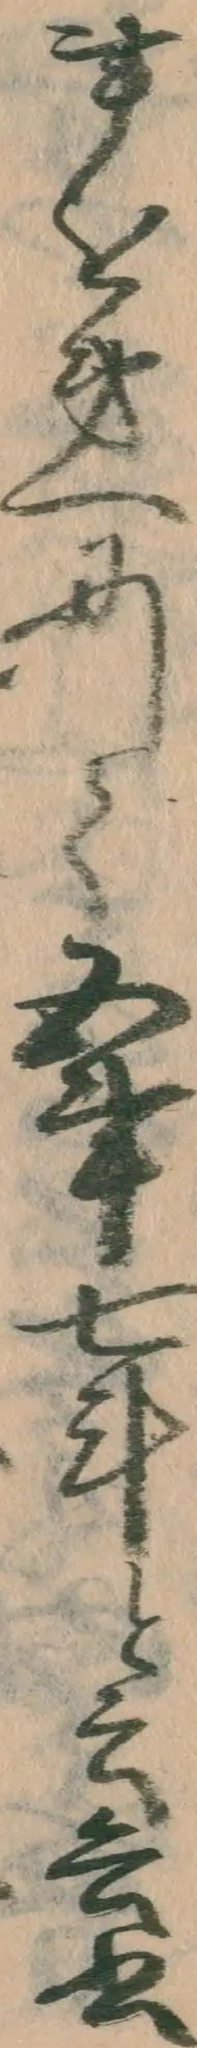事を第一にして五事七斗と云兵書
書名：麗斎叢書. 20
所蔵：国立国会図書館 National Diet Library, JAPAN
